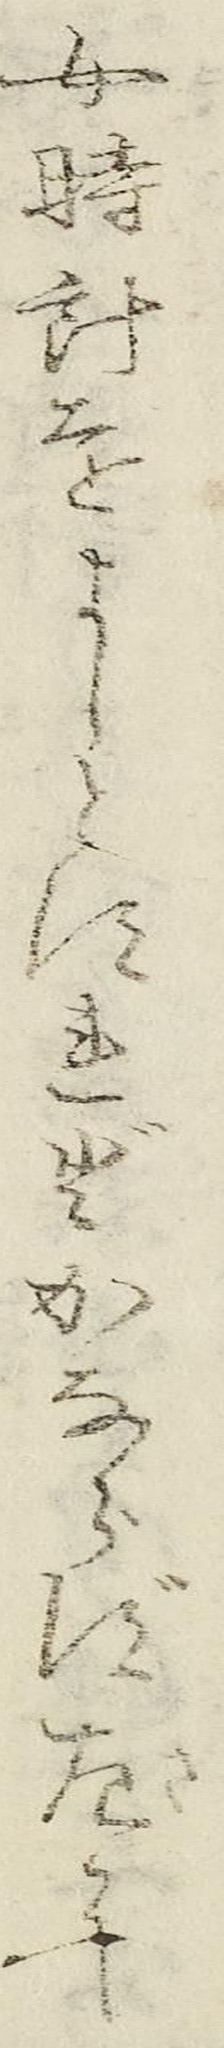女時計をよしとすれどかならず左には
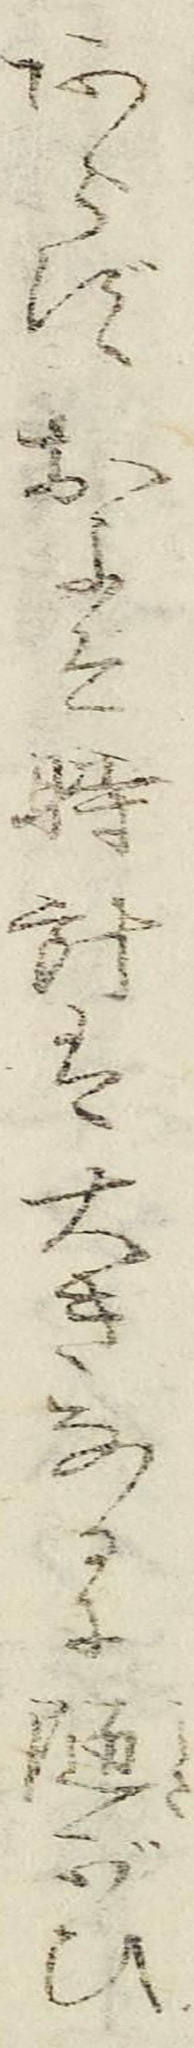あらずおよそ時計は大きなるに随がひ
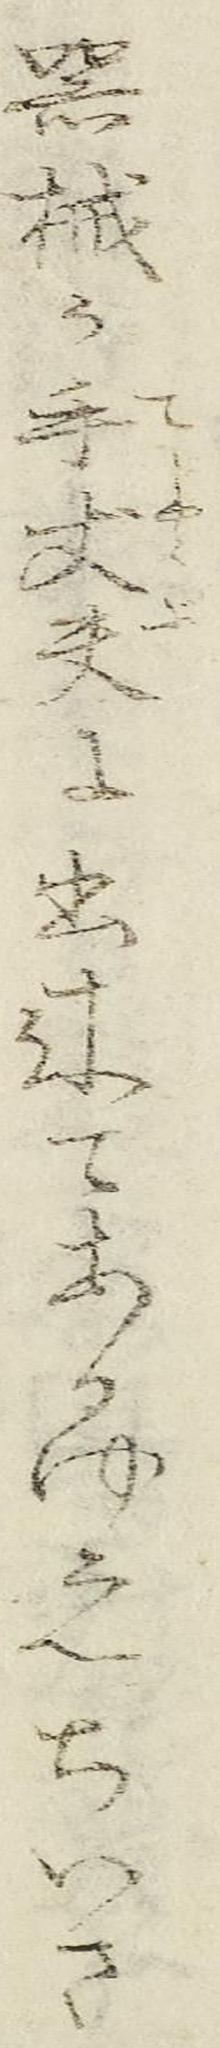器械か手丈夫に出来てあるゆえちいさ
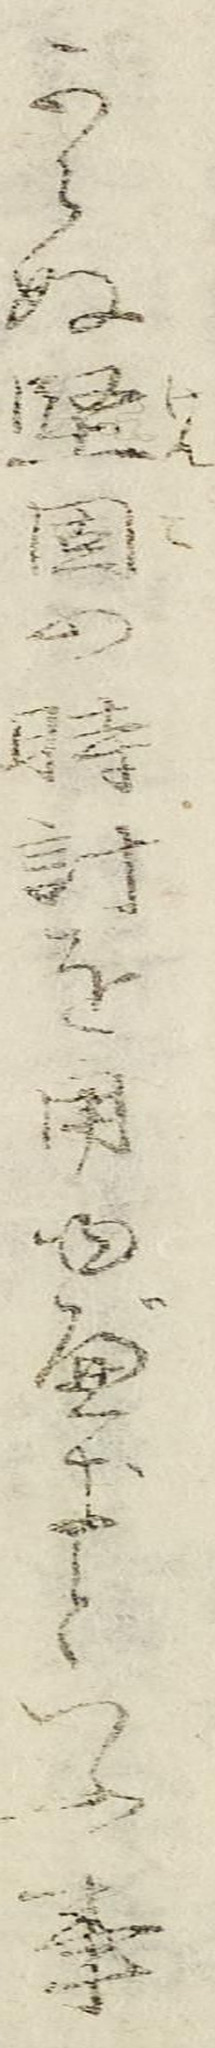からぬ堅固の時計を用ゆべきといふ事
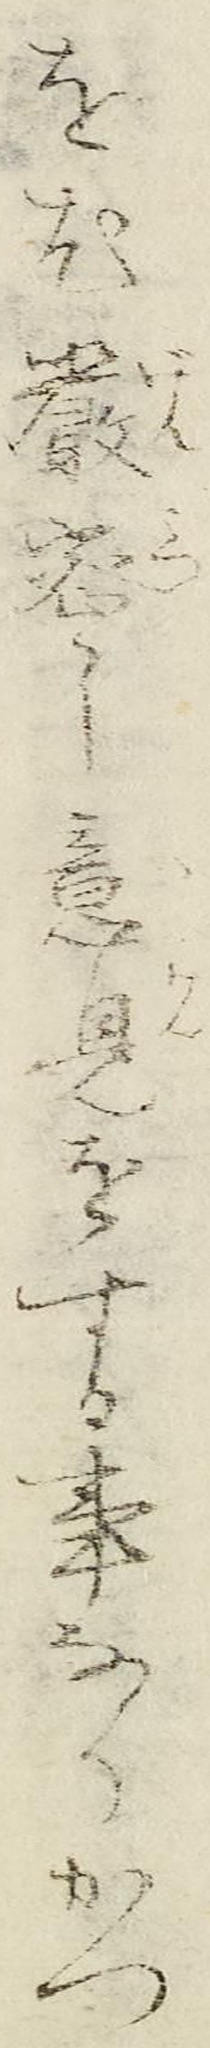をも厳密に意見をする事なりかつ
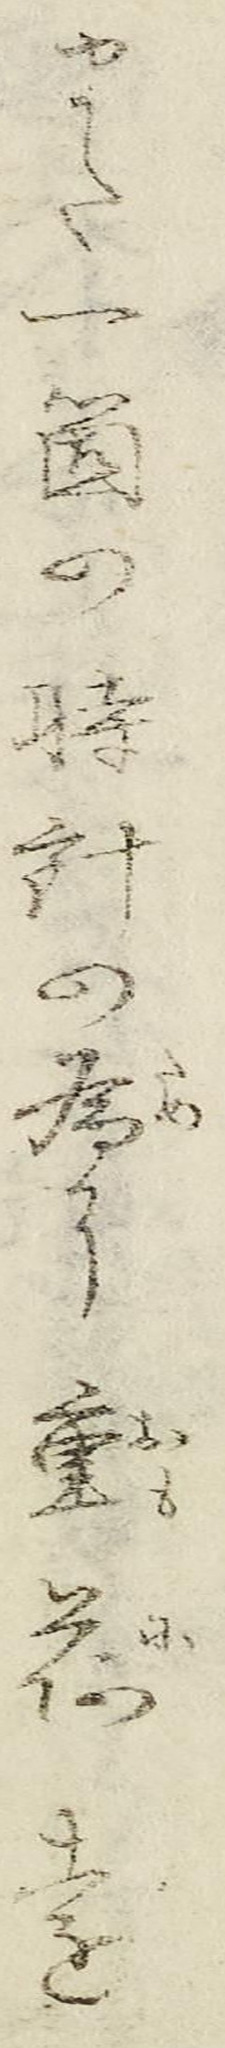また一箇の時計の為に重荷を
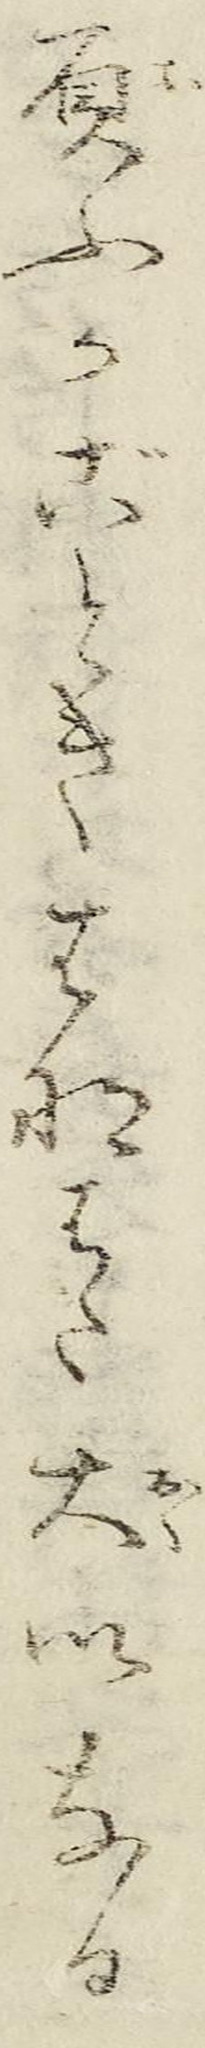負ふかごときはなはた大いなる
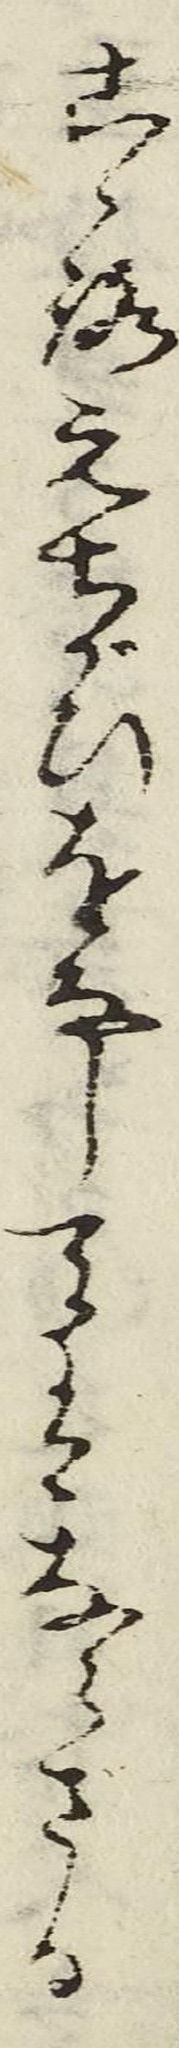こゝろえちがひをなしてはならさる
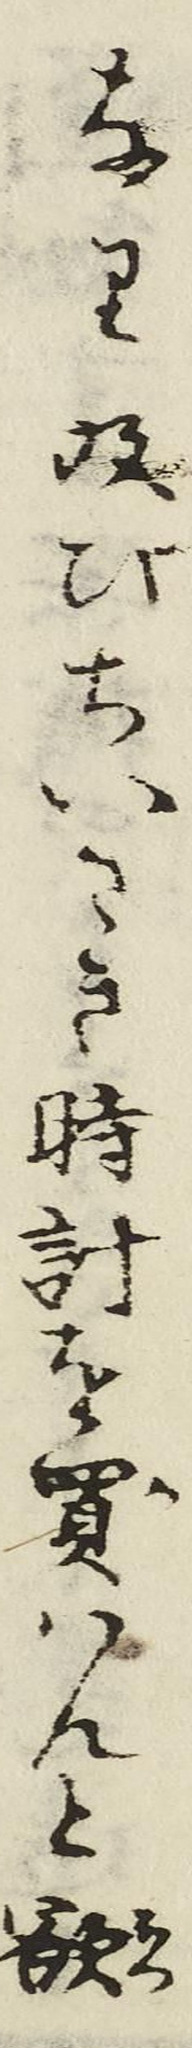なり及びちいさき時計を買はんと欲
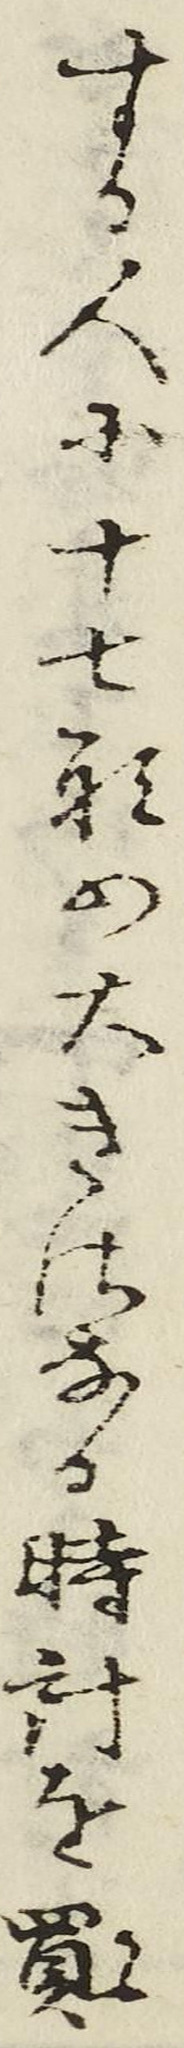する人に十七形の大きさなる時計を買
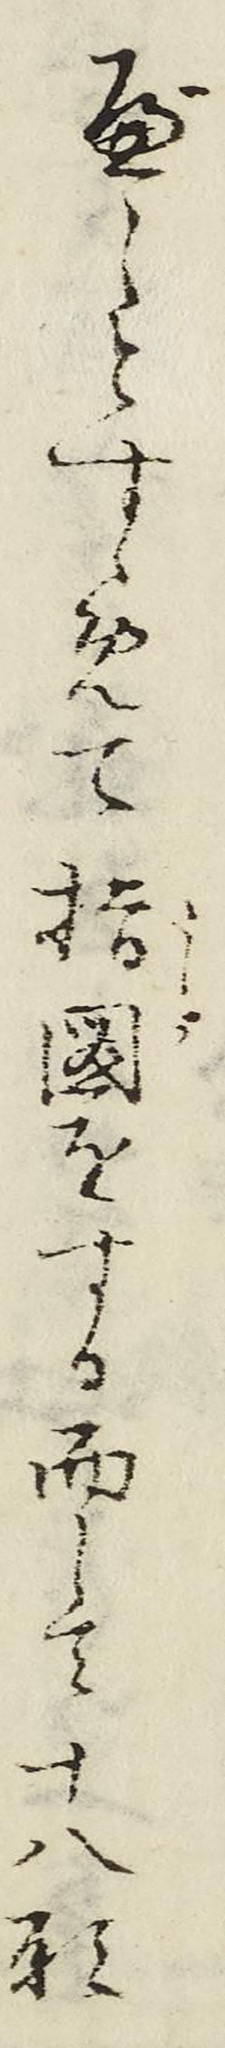べしとすゝめて指図をする而して十八形
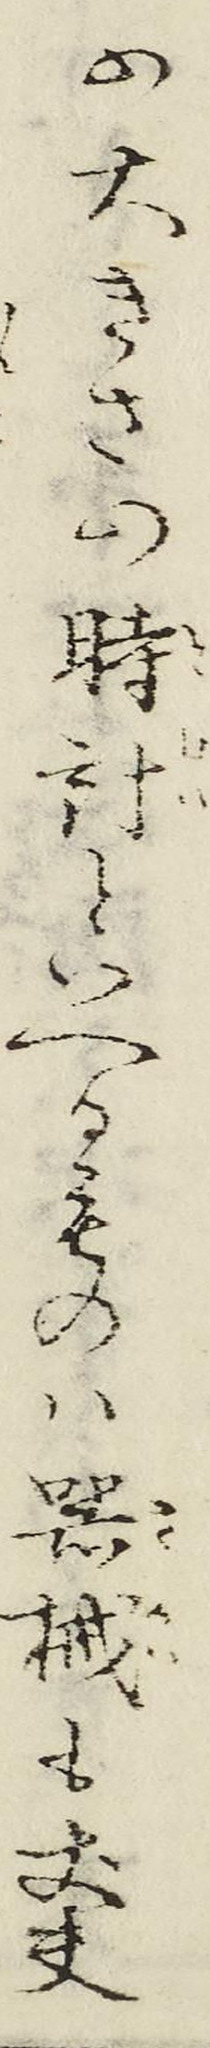の大きさの時計といへるものは器械も丈夫
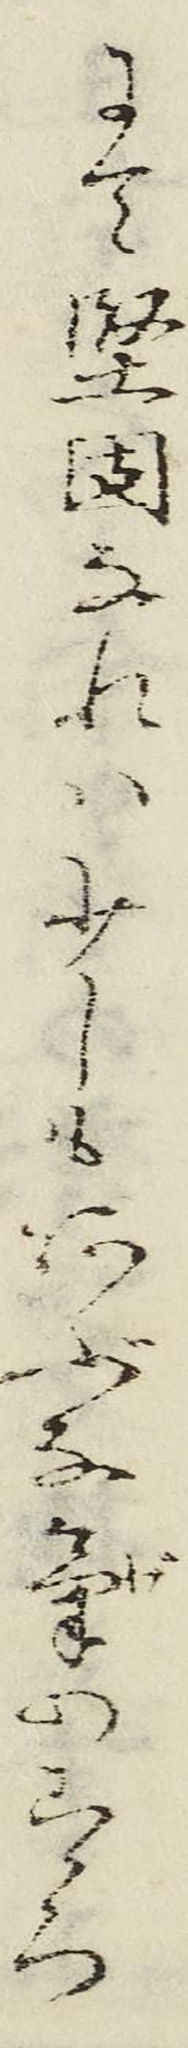にて堅固なれは少しもあぶな気のこゝろ
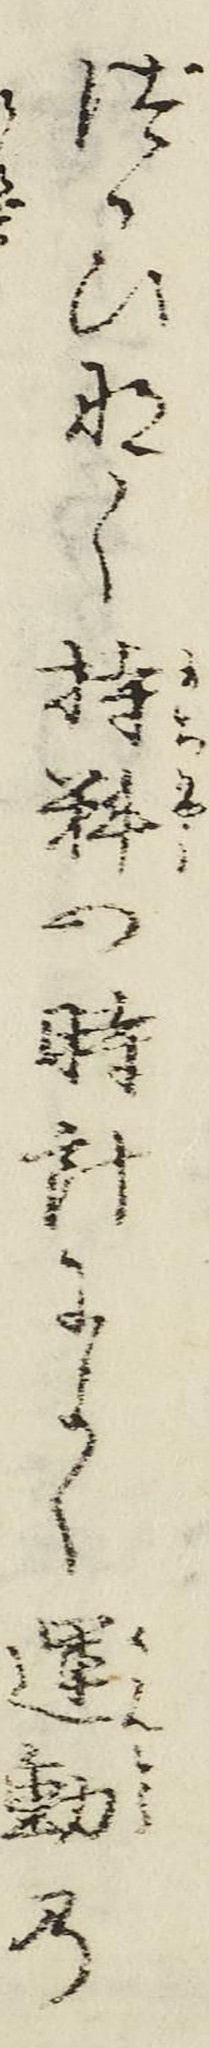づかひなし持料の時計によく運動の
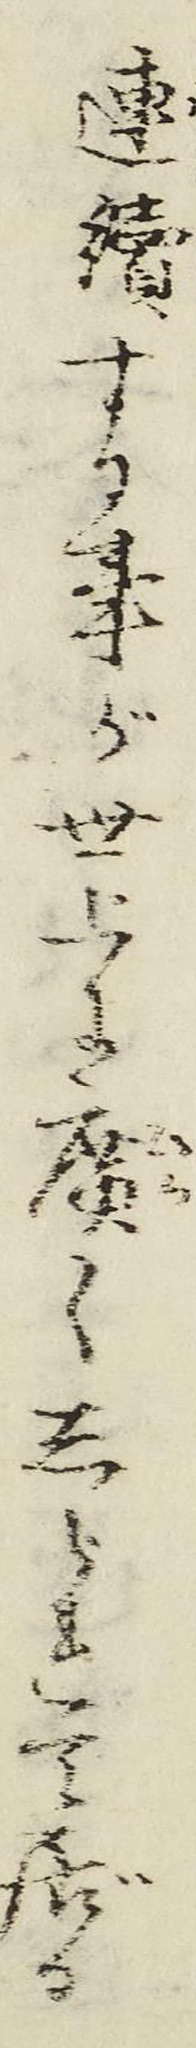連続する事が世上に広くしられて居る
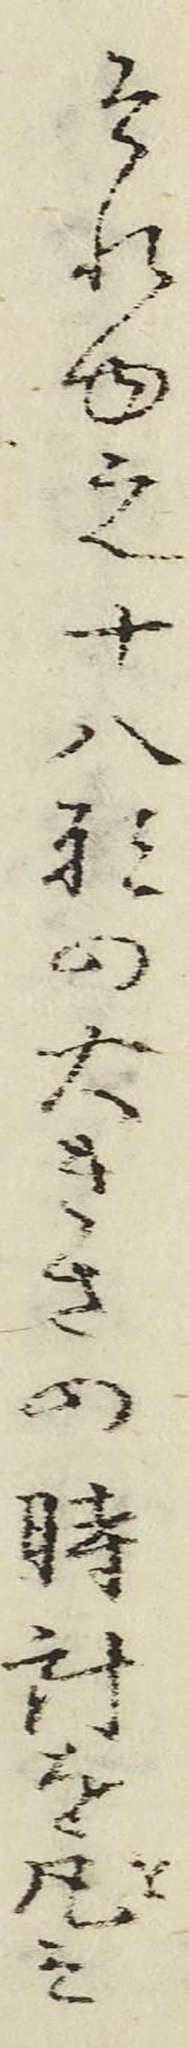それゆえ十八形の大きさの時計を凡そ
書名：[時計に関する冊子]
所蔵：東京大学地震研究所図書室 Earthquake Research Institute Library, The University of Tokyo, JAPAN
